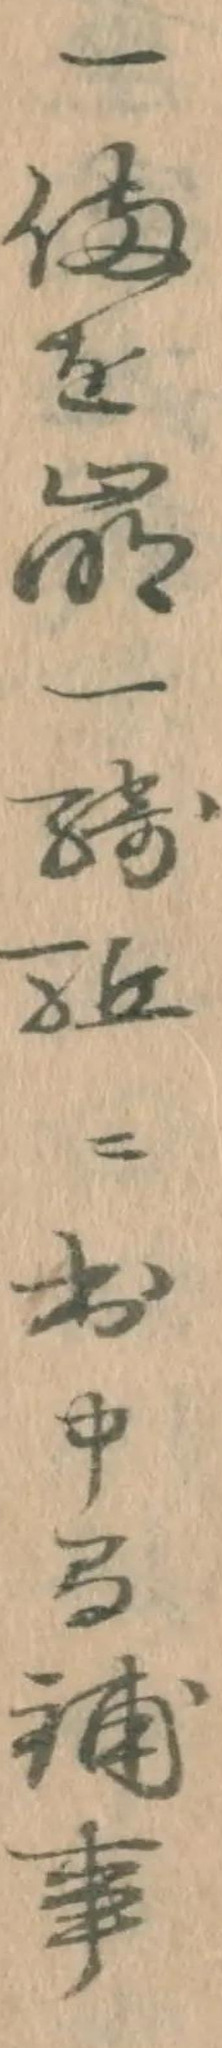一備を崩一騎駈に出申間鋪事
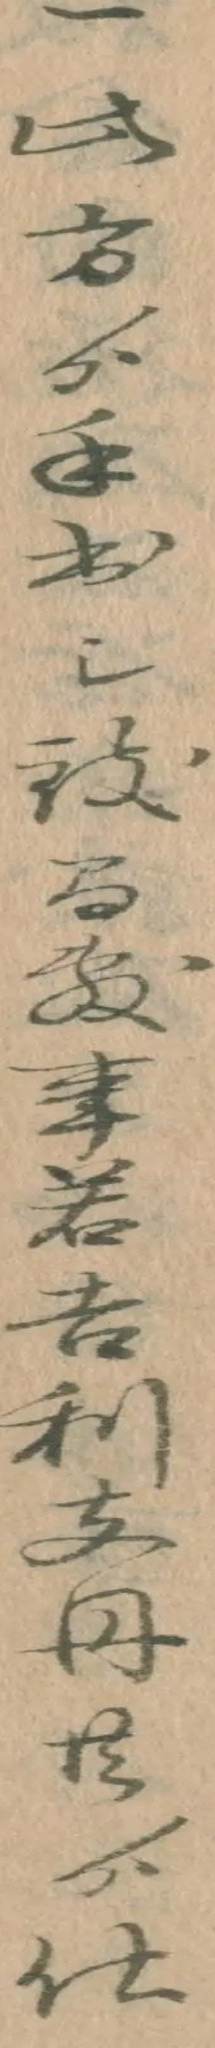一此方ゟ手出し致間敷事若吉利支丹共ゟ仕
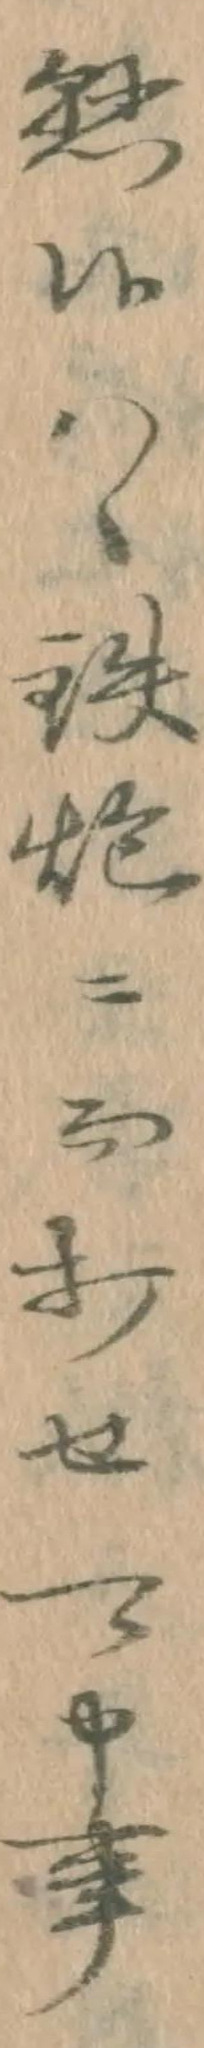懸候はゝ鉄炮に而打せ可申事
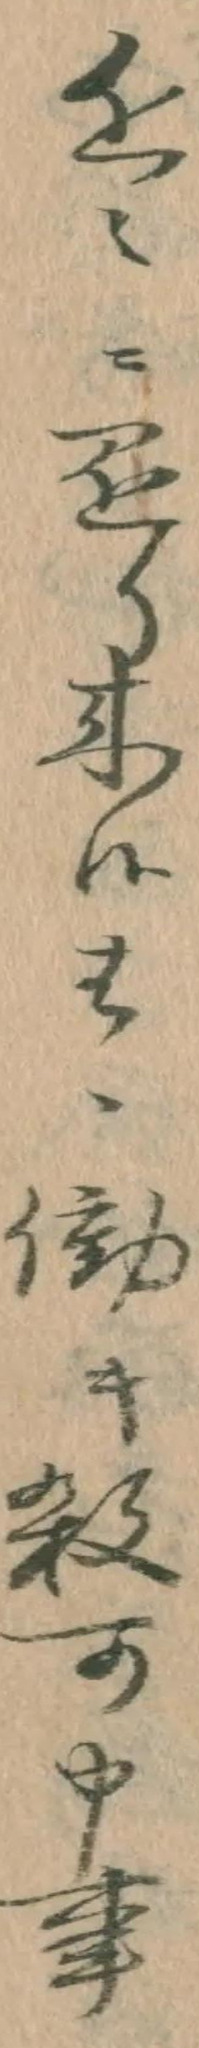近々に懸り来候はゝ働き殺可申事
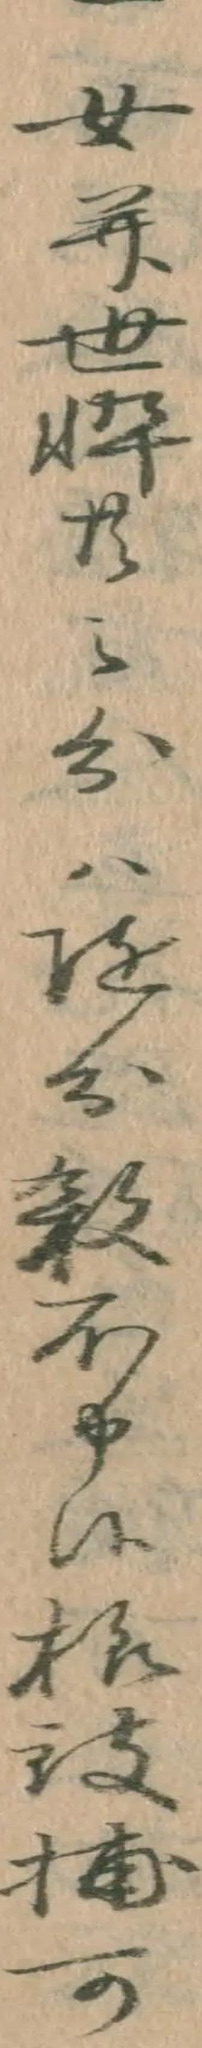一女并世悴共之分は随分殺不申候様致捕可
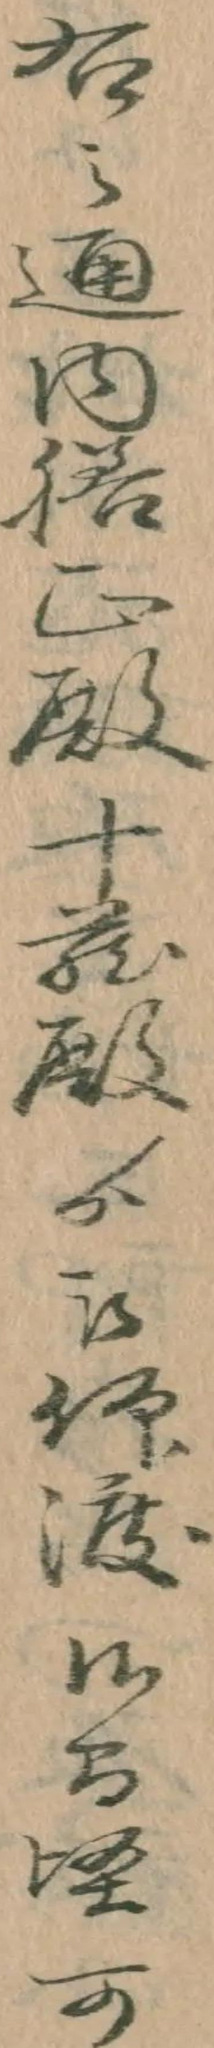右之通内膳正殿十蔵殿ゟ被仰渡候間堅可
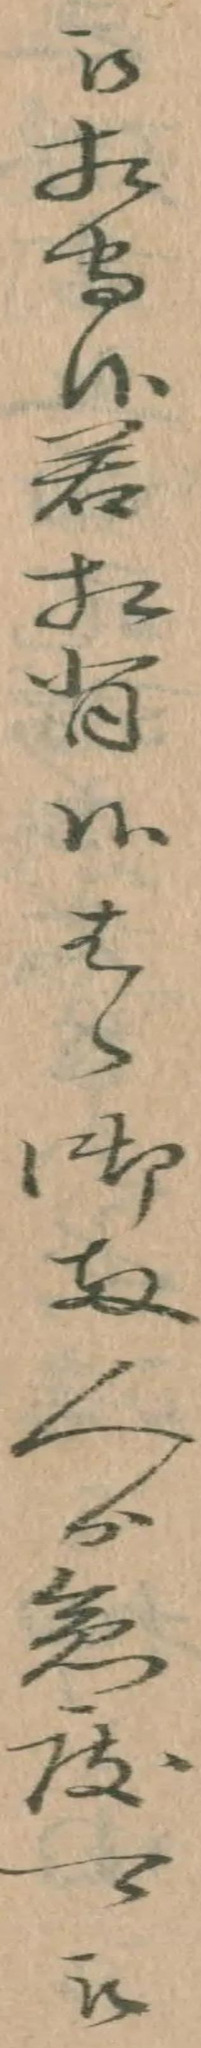被相守候若相背候はゝ御両人ゟ急度可被
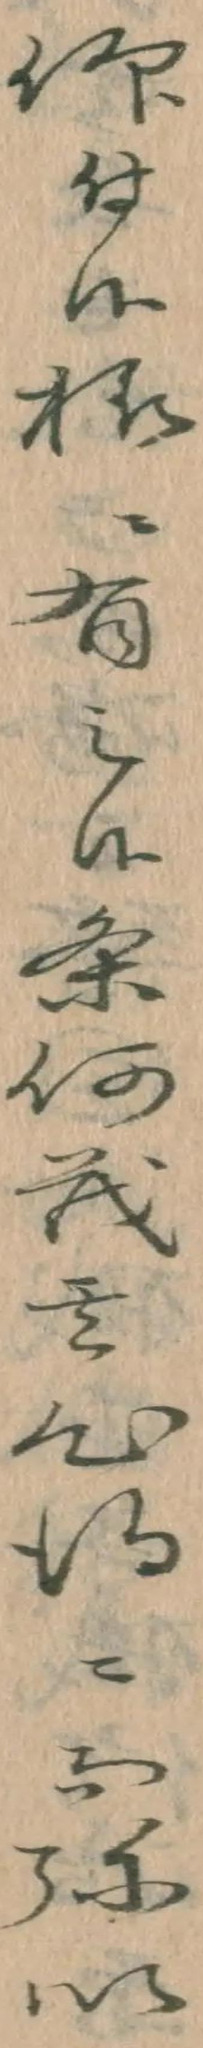仰付候様に有之候条何も其心得に而弥以
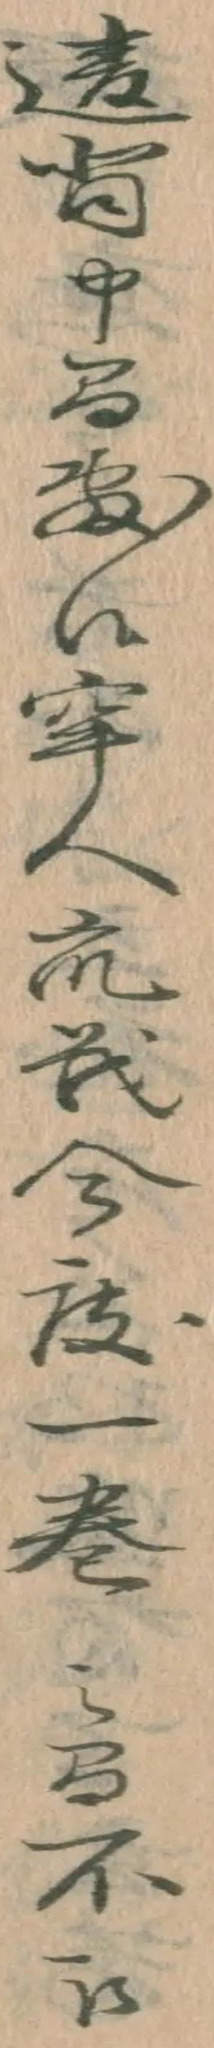違背申間敷候牢人衆も今度一巻之間不被
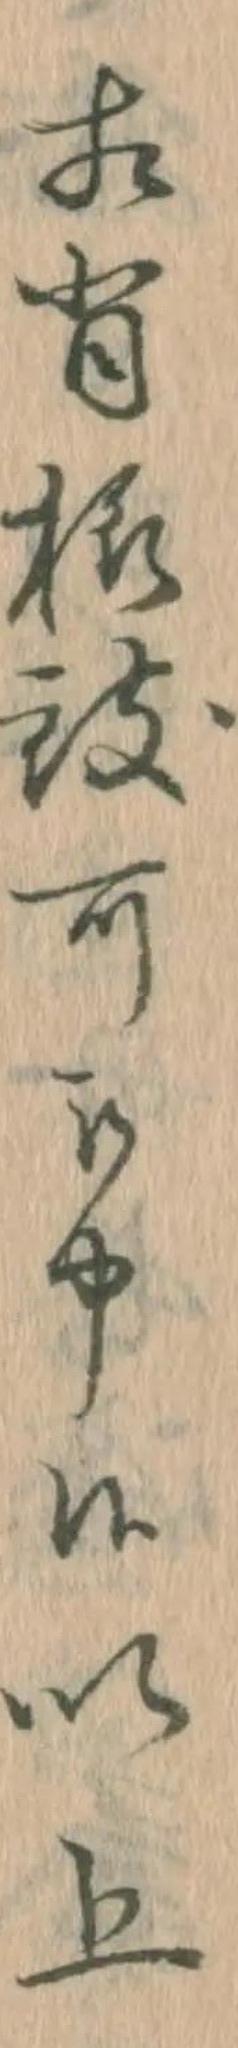相背様致可被申候以上
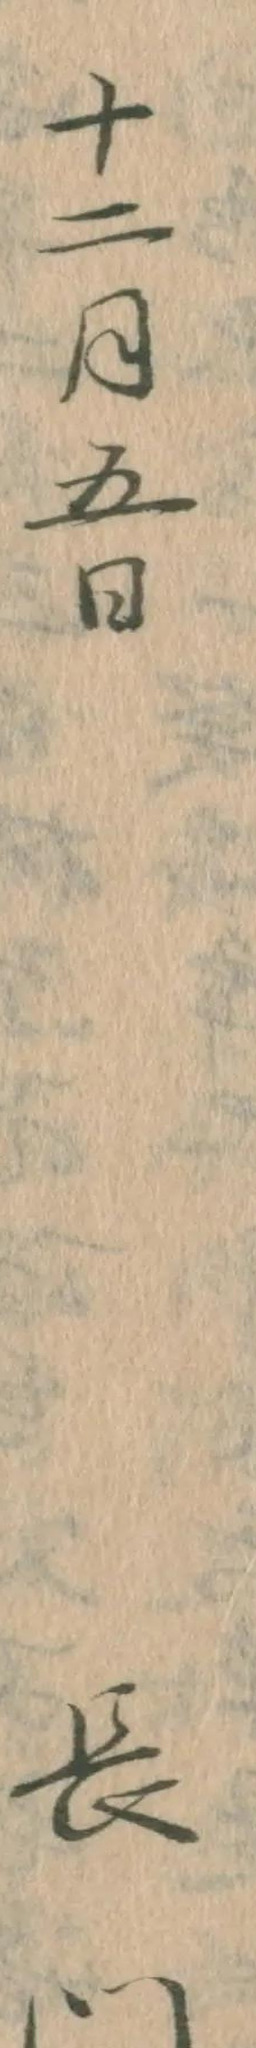十二月五日長門
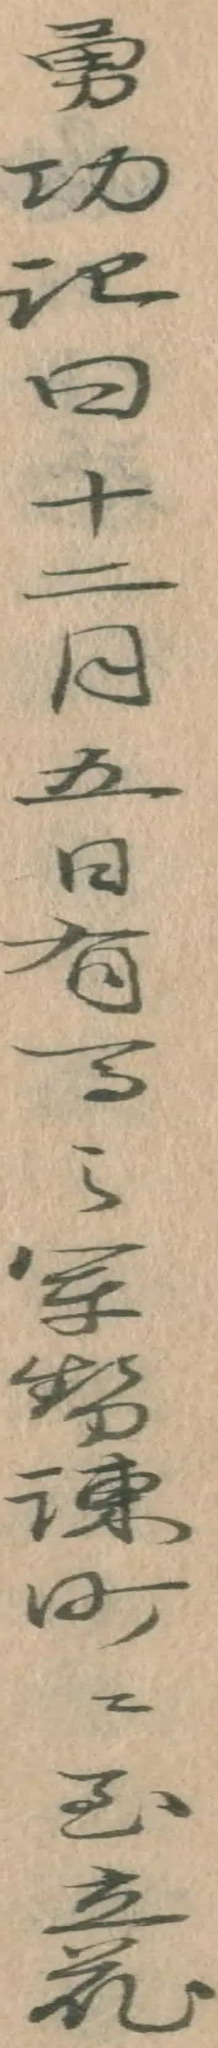勇功記曰十二月五日有馬之軍勢諫町に至立花
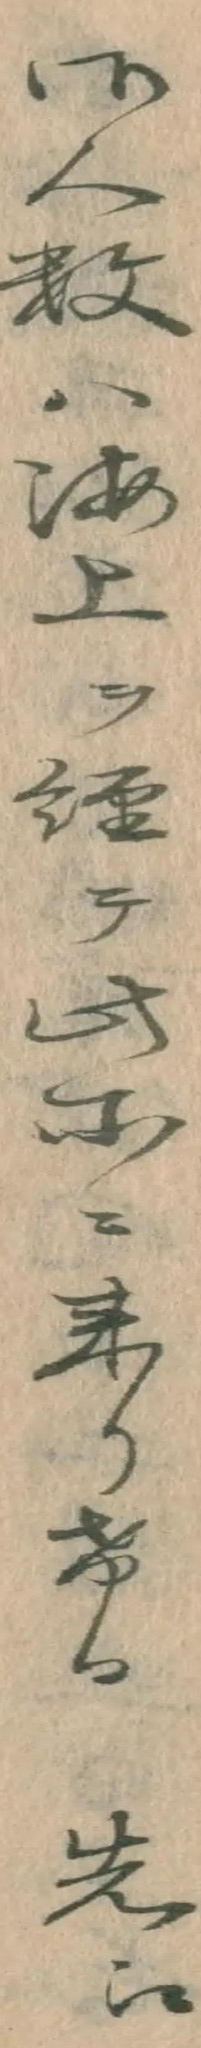御人数は海上を経て此所に来りける先江
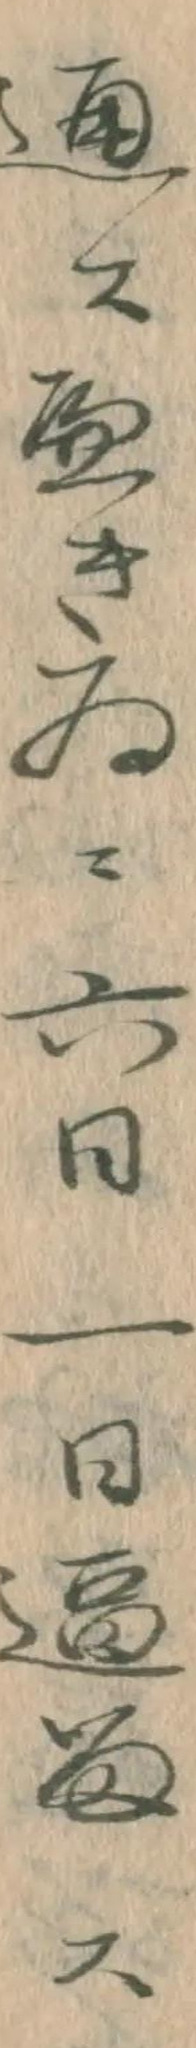通すへき為に六日一日逗留す
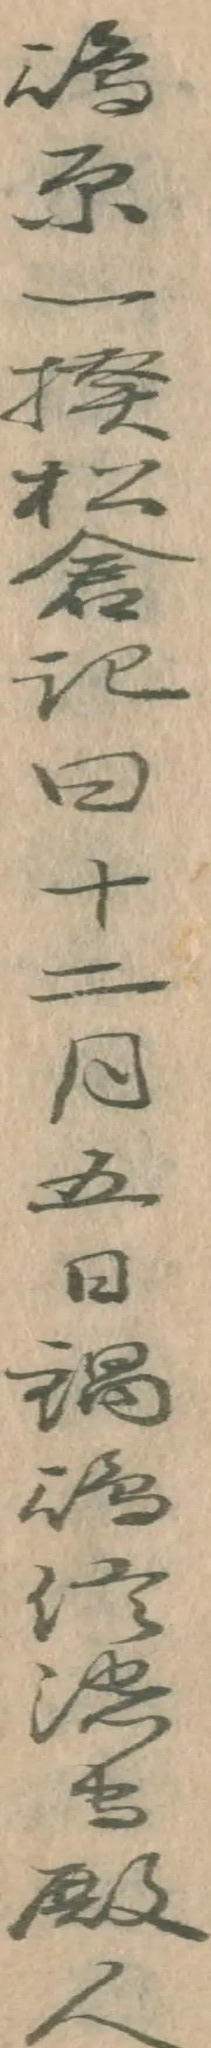島原一揆松倉記曰十二月五日鍋島信濃守殿人
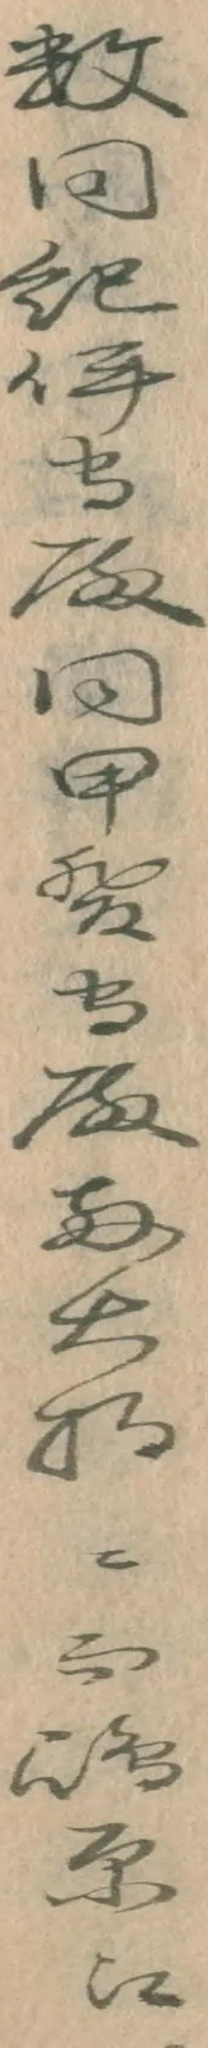数同紀伊守殿同甲斐守殿両大将に而島原江
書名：切支丹御退治記 49巻. [3]
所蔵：国立国会図書館 National Diet Library, JAPAN
